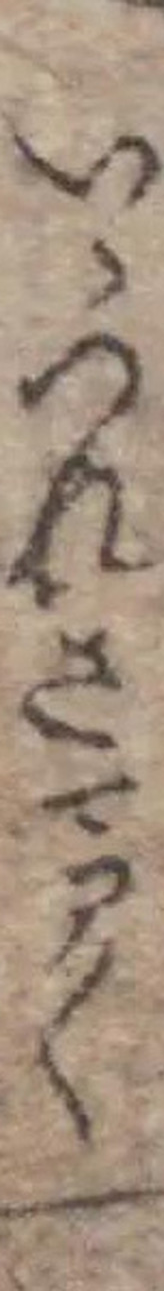いゝつれさマア〳〵
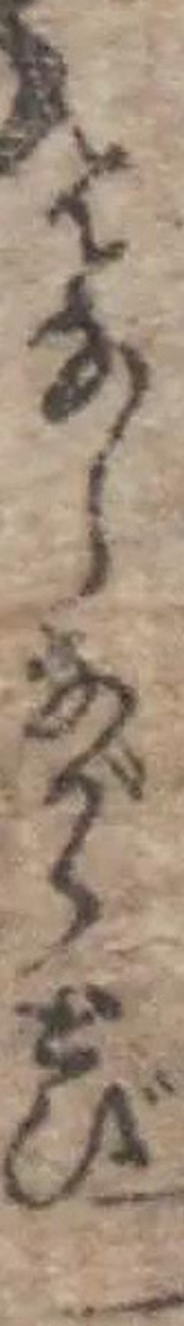はなしながらとび
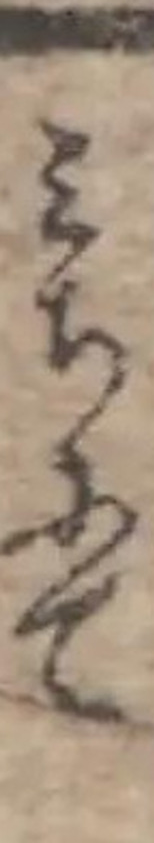ミちにて
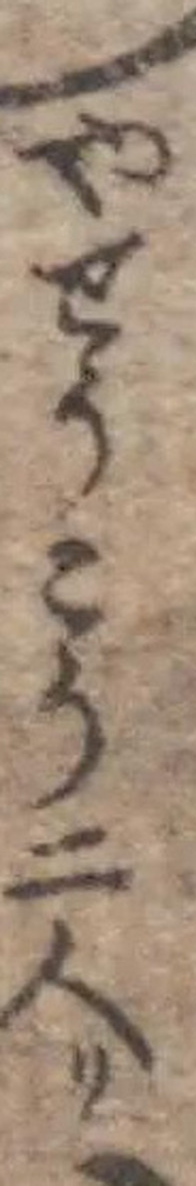やせるこう二人り
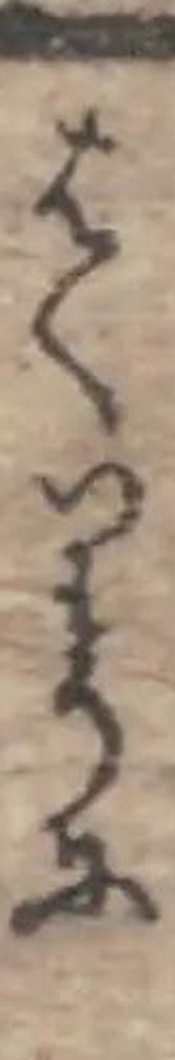はくりうに
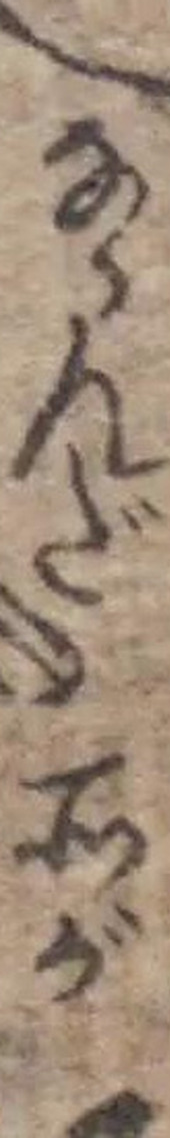ならんだ所が
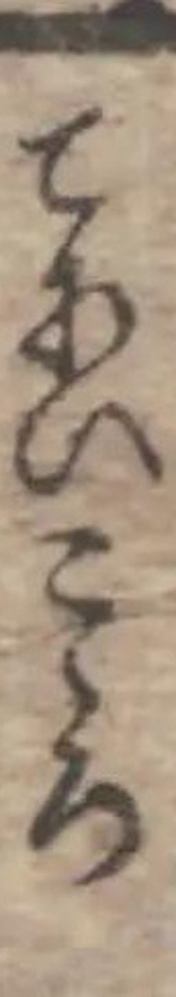てあいこゝろ
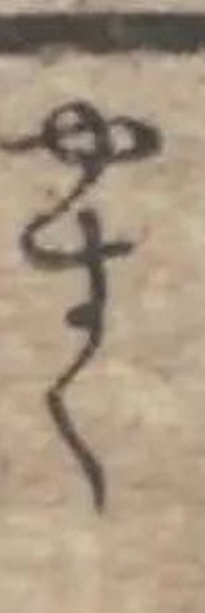やすく
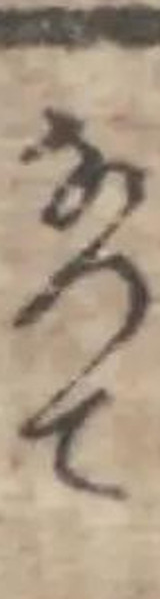なつて
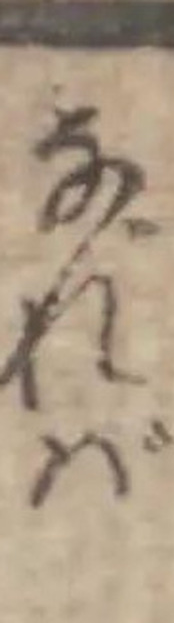なれバ
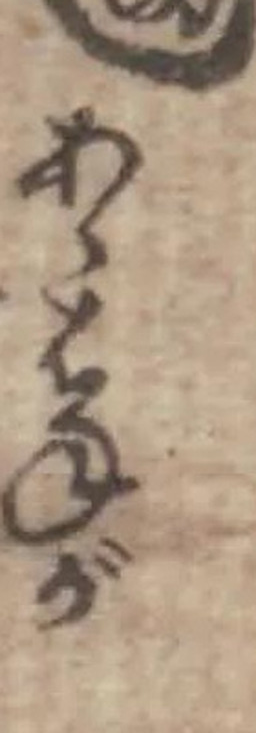あゝはねが
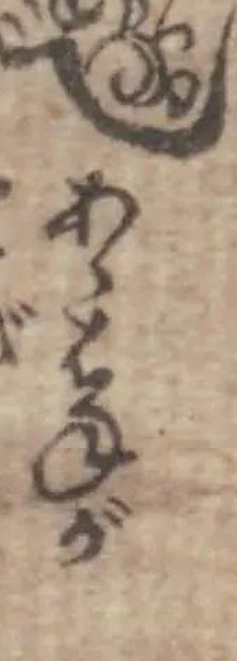あゝはねが
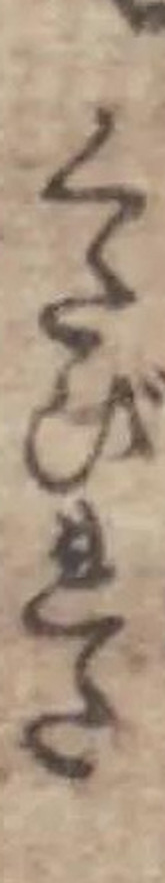くたびれた
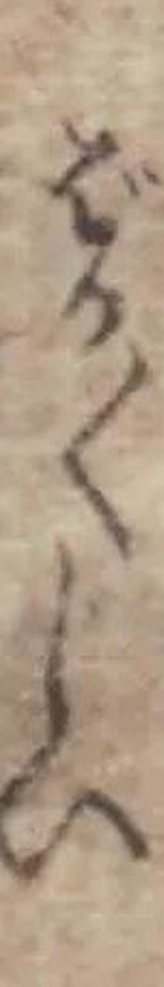ばか〳〵しい
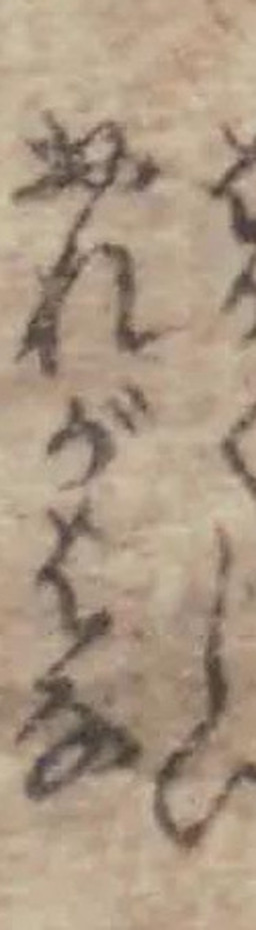おれがはな
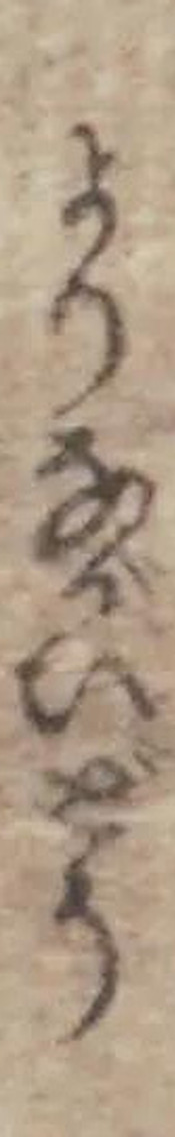よりながいどう
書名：草紙の曙 3巻
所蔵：国立国会図書館 National Diet Library, JAPAN
